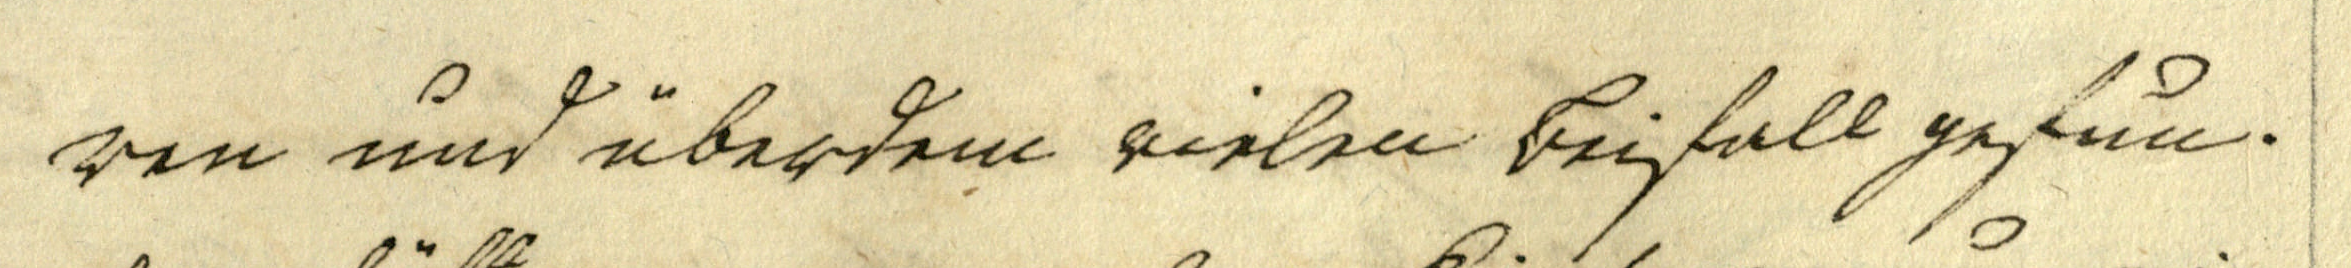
ren und überdem vielen Beifall gefun¬
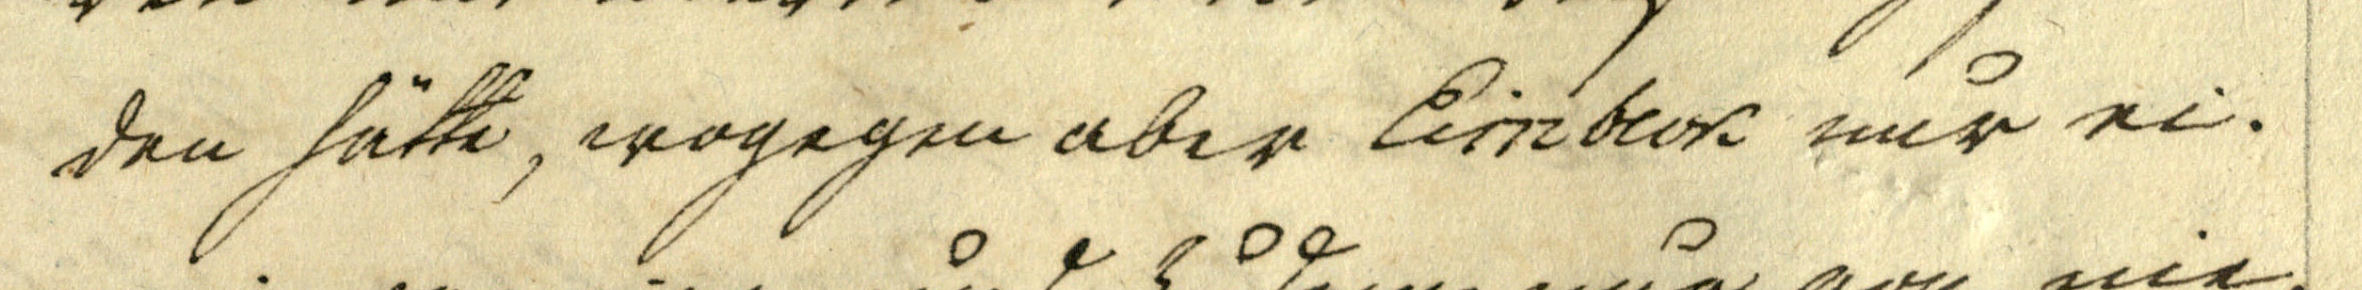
den hätte, wogegen aber Eimbeck nur ein¬
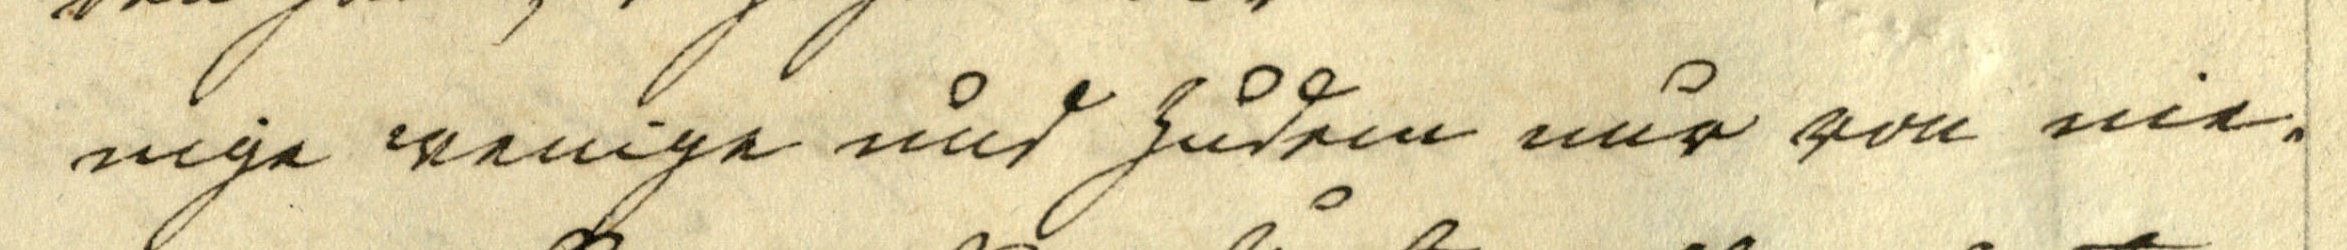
einige wenige und zudem nur von nie¬
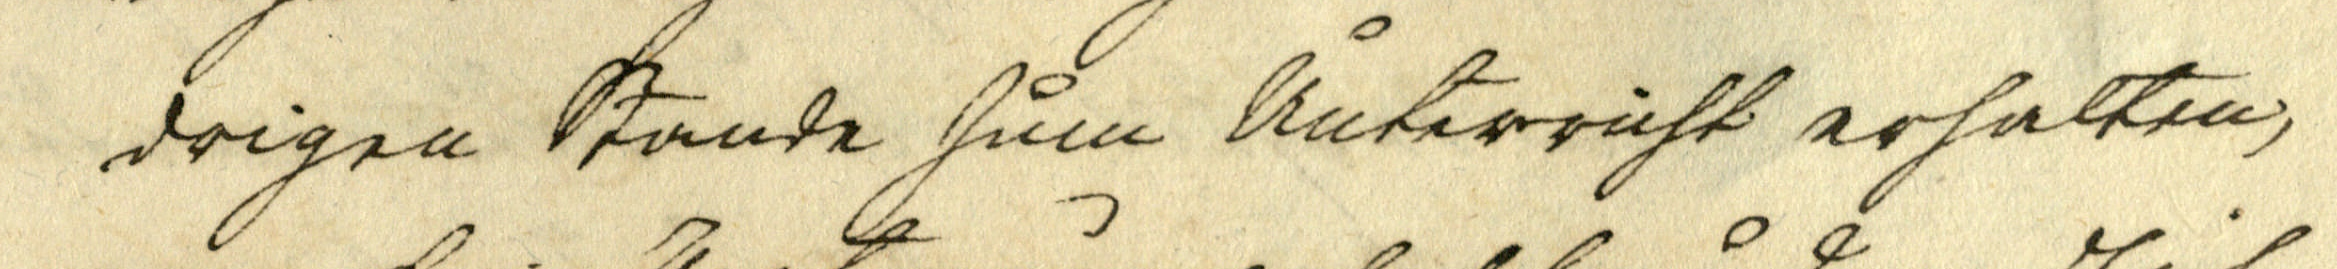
drigen Stande zum Unterricht erhalten,
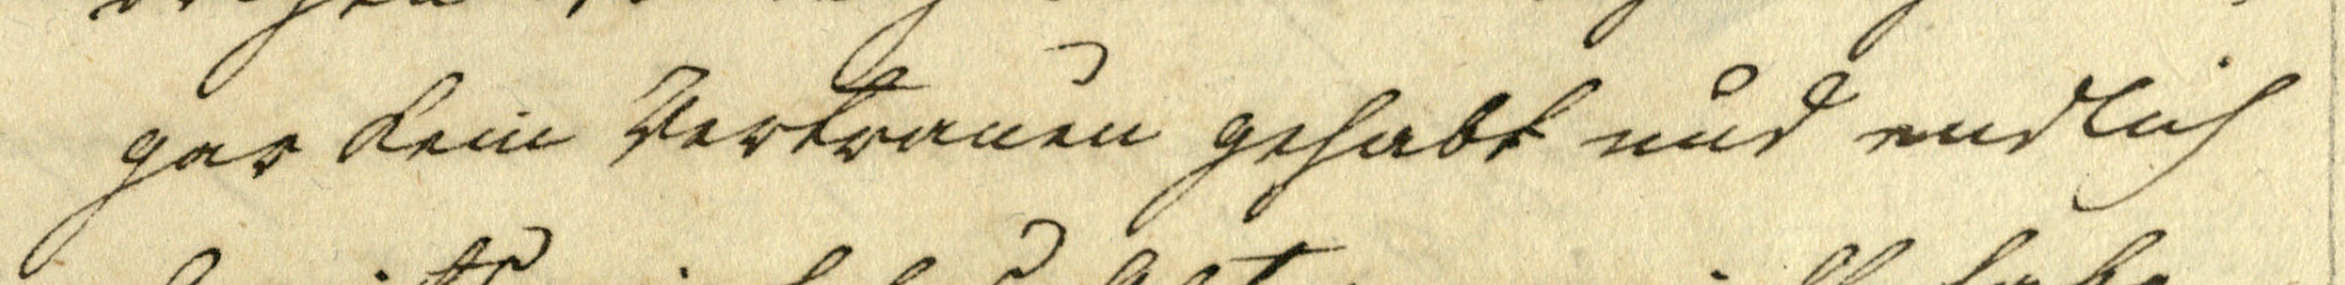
gar kein Vertrauen gehabt und endlich
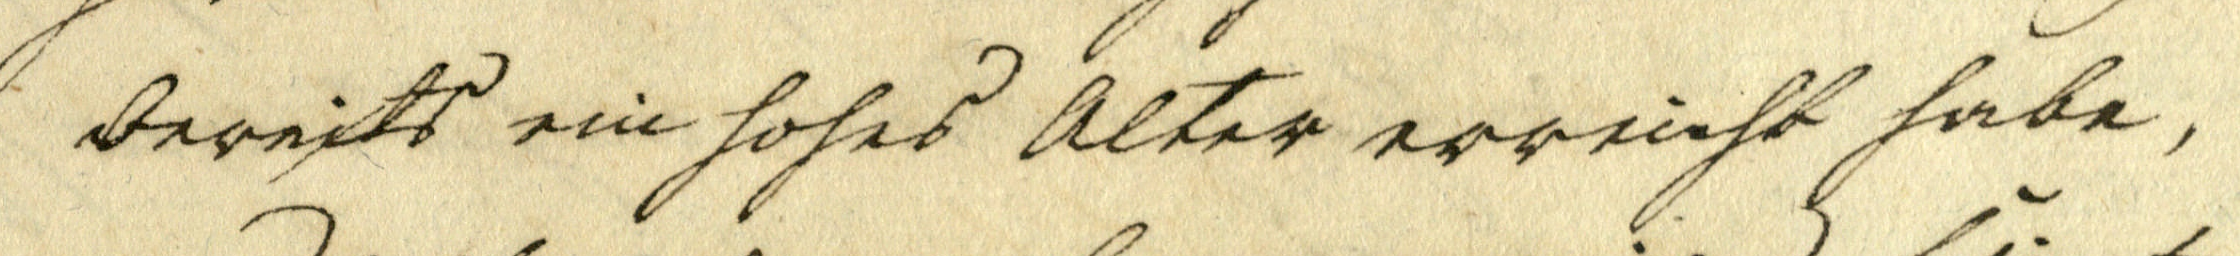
bereits ein hohes Alter erreichet habe,
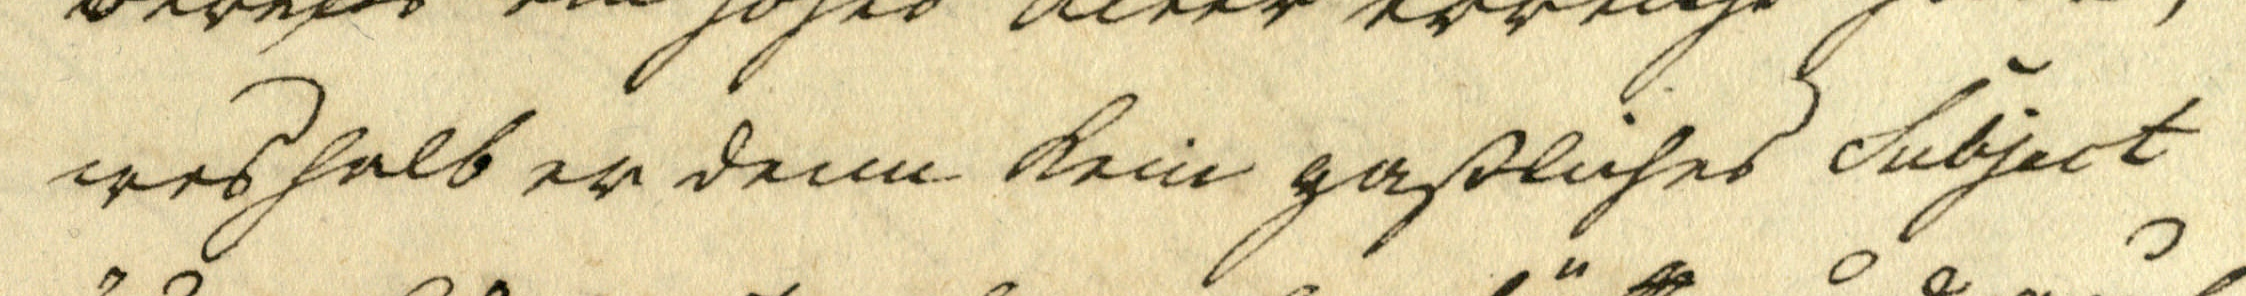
weshalb er denn kein paßliches Subject
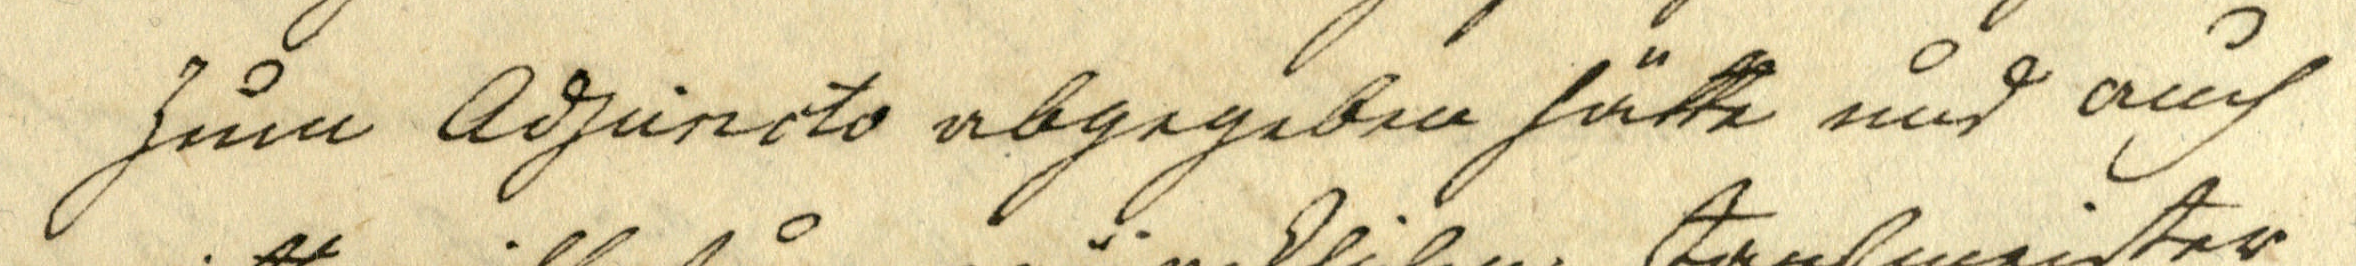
zum Adjuncto abgegeben hätte und auch
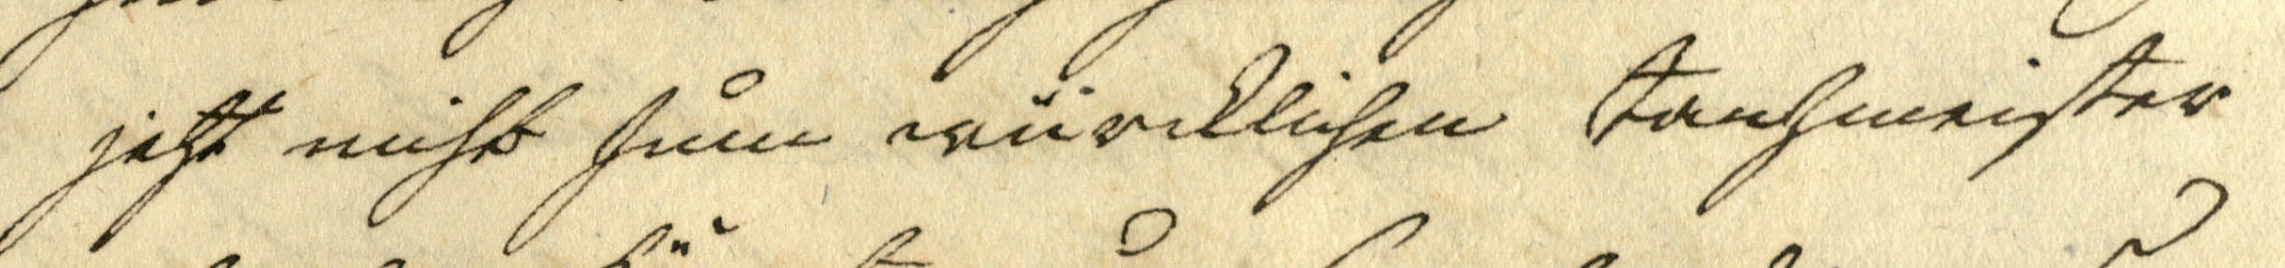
jetzt nicht zum würcklichen Tanzmeister
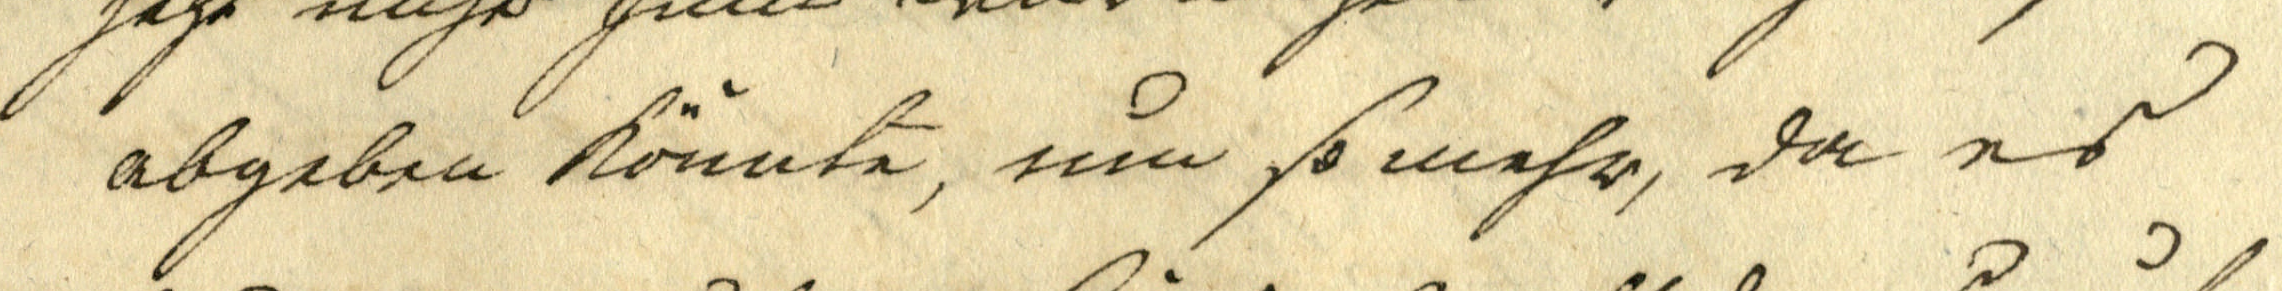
abgeben könnte, um so mehr, da es
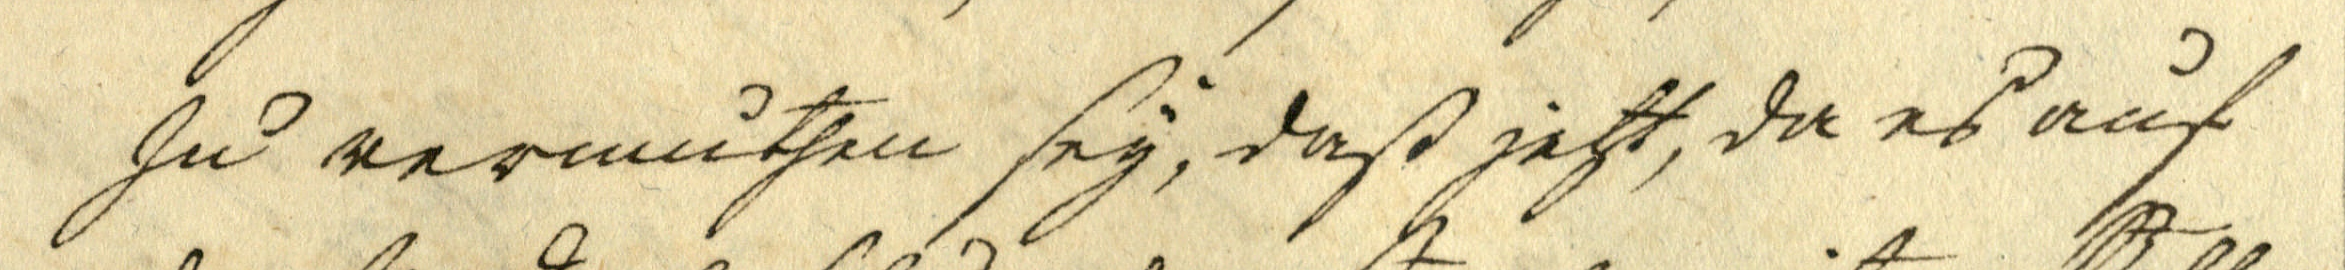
zu vermuthen seÿ, daß jetzt, da es auf
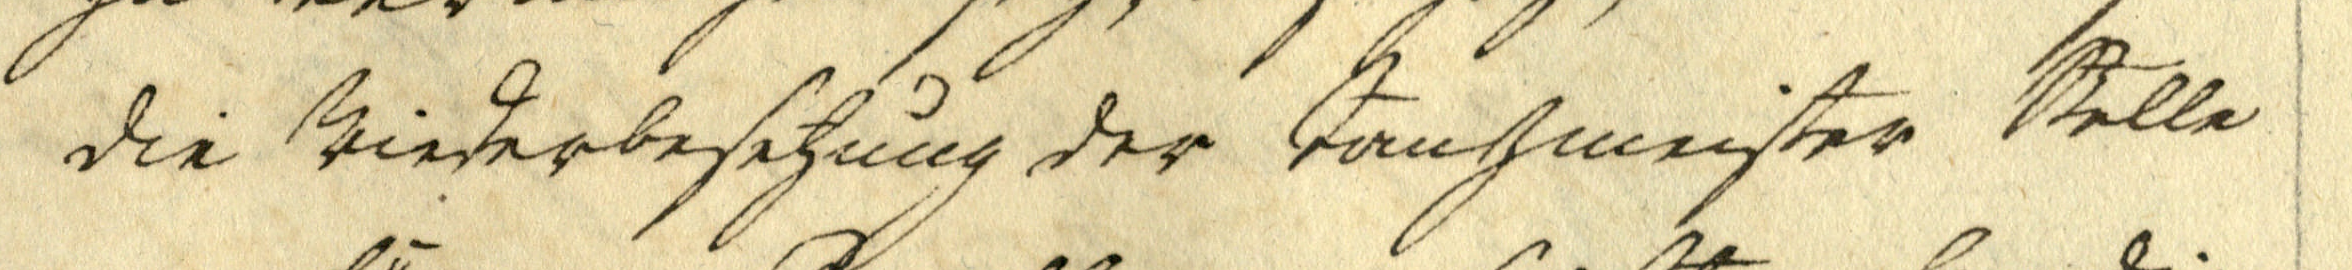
die Wiederbesetzung der Tanzmeister Stelle
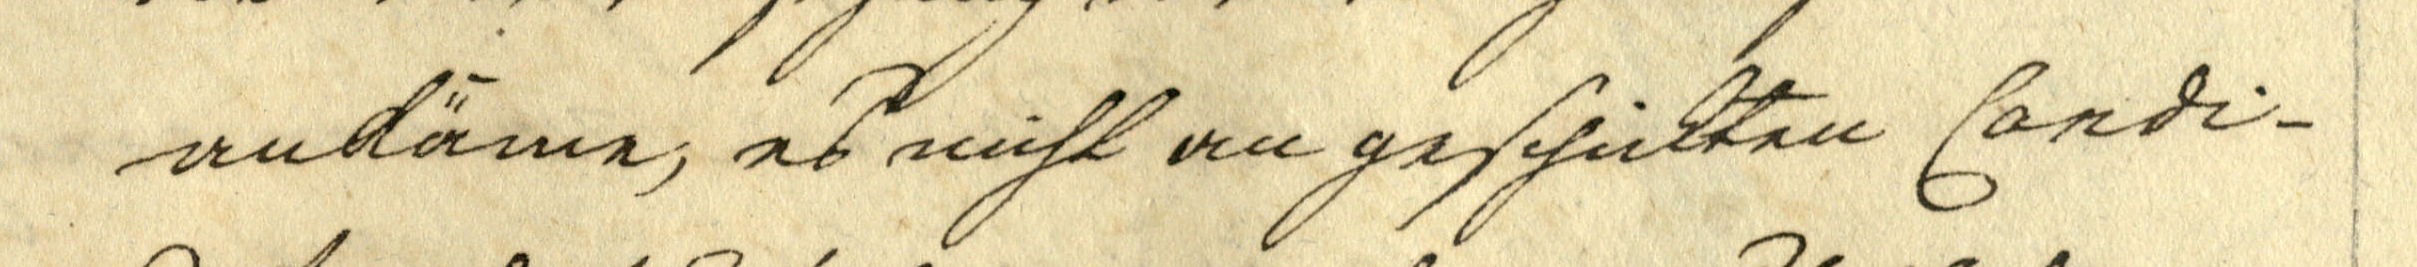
ankäme, es nicht an geschickten Candi¬
